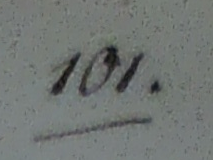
101.
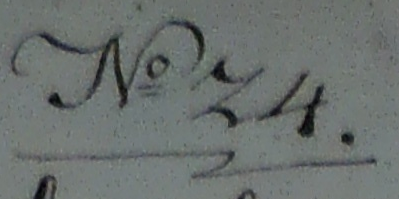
No͇ 24.
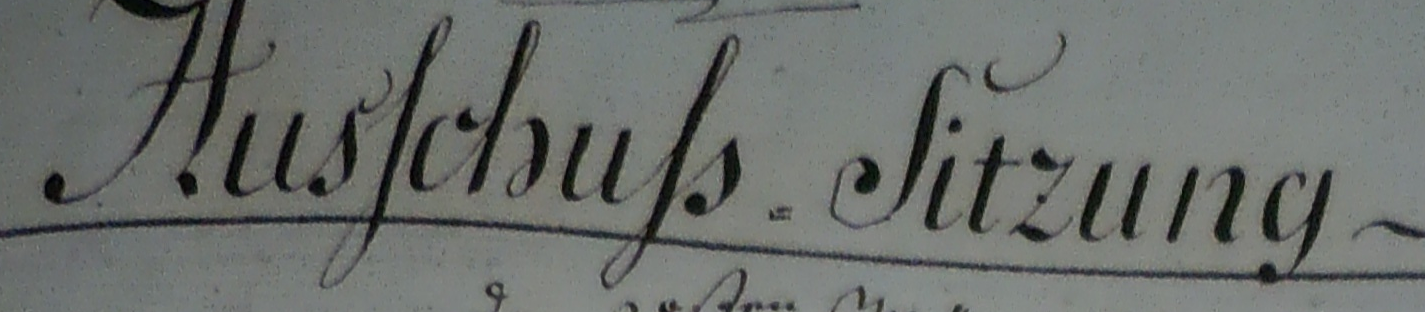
Ausschuss‗Sitzung
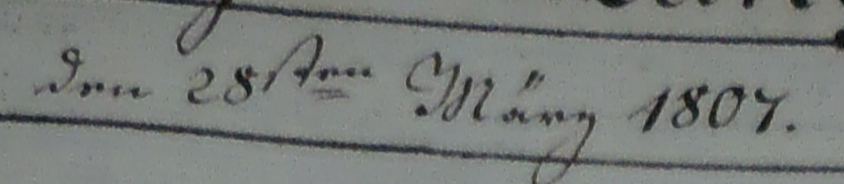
den 28ste͇n März 1807.
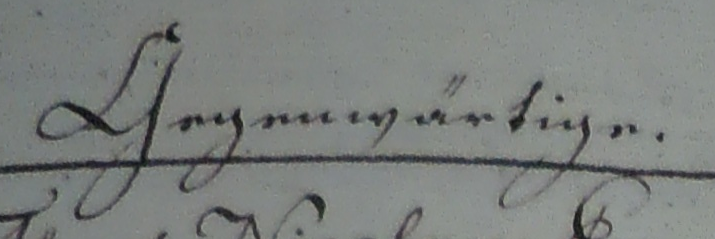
Gegenwärtige.
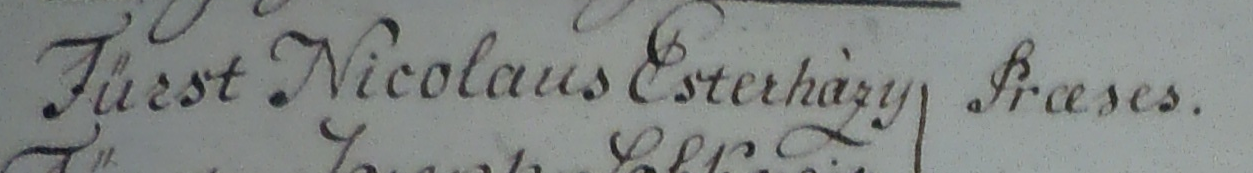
Fürst Nicolaus Esterhàzy Præses.
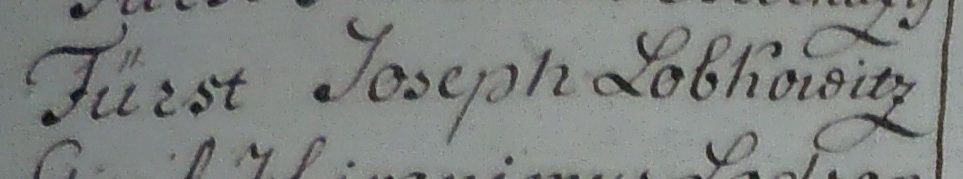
Fürst Joseph Lobkowitz
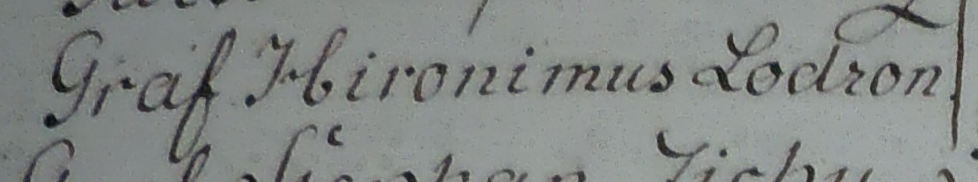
Graf Hironimus Lodron
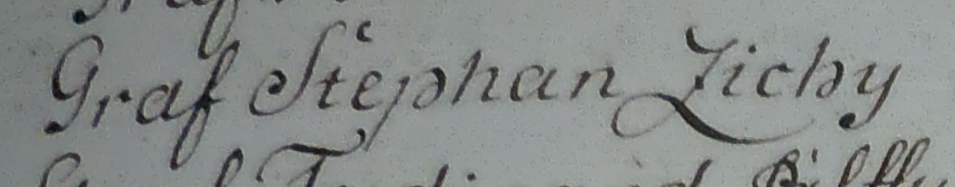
Graf Stephan Zichy
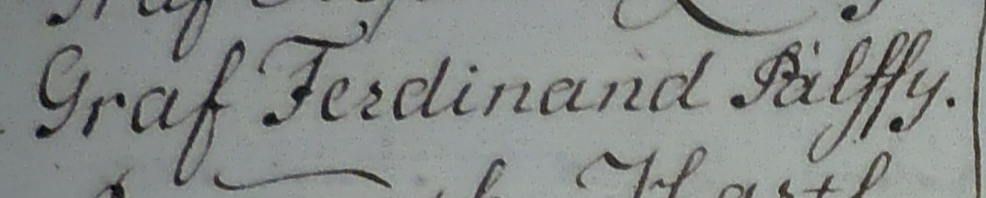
Graf Ferdinand Pàlffy.
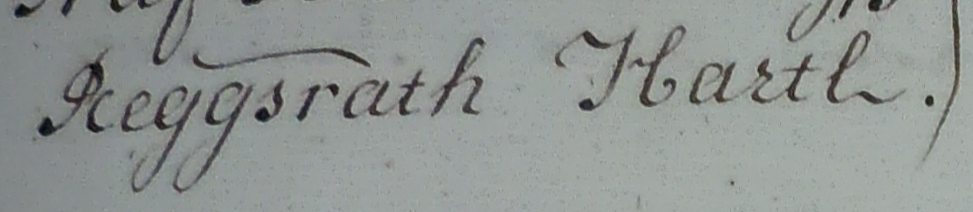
Reg͞gsrath Hartl.
